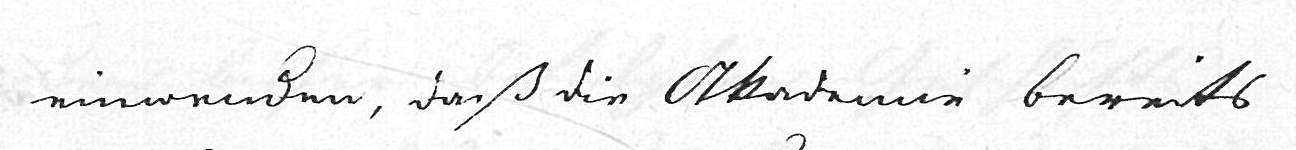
einwenden, daß die Akademie bereits
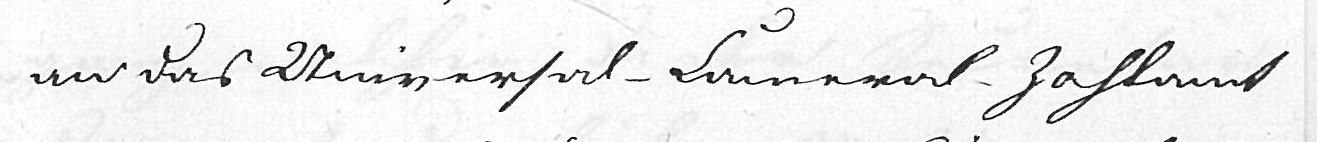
an das Universal-Cameral-Zahlamt
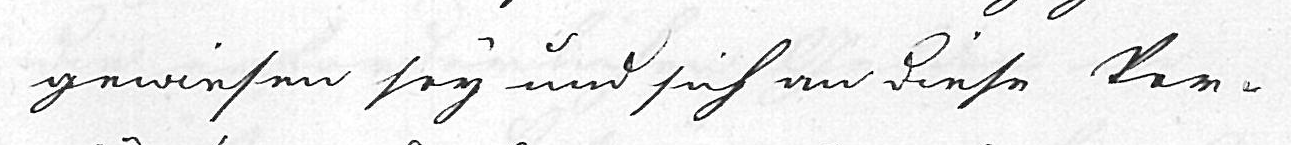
gewiesen sey und sich an diese Ver-
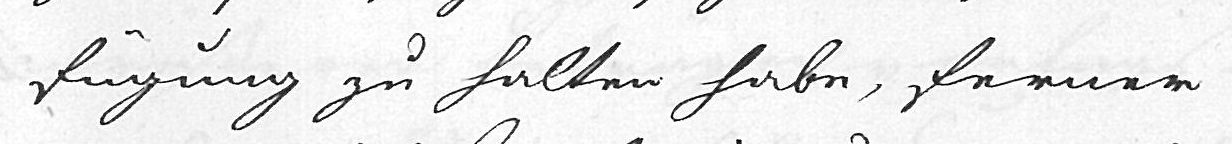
fügung zu halten habe, ferner
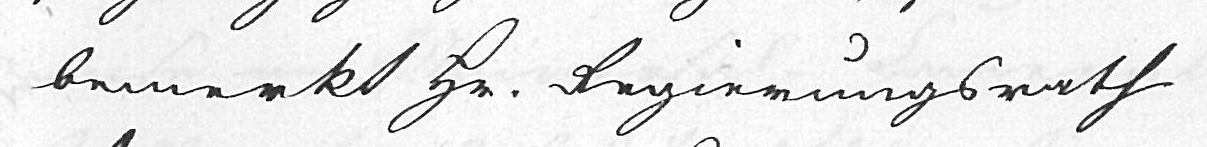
bemerkt Hr. Regierungsrath
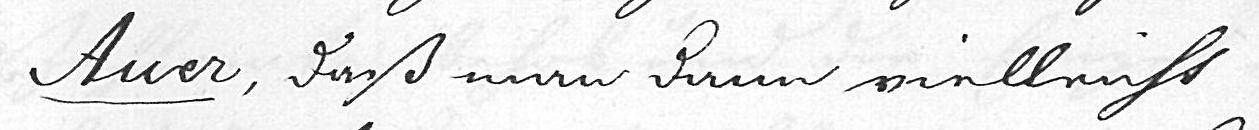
Auer, daß man dann vielleicht
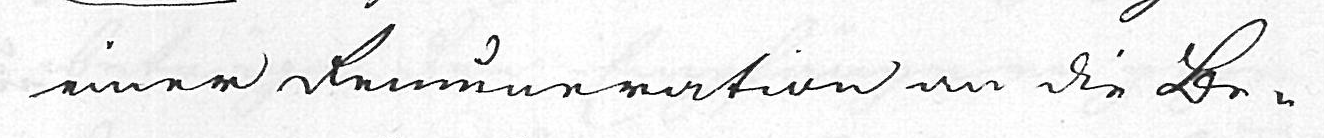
einer Remuneration an die Be-
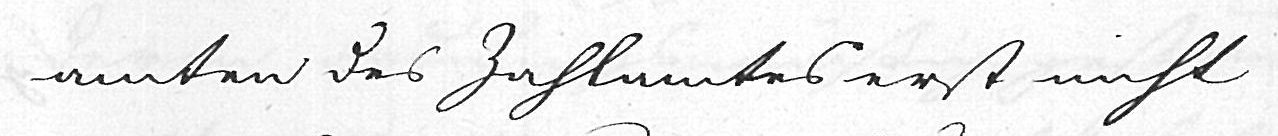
amten des Zahlamtes erst nicht
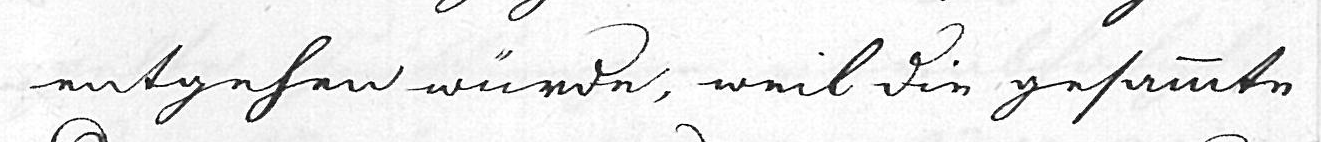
entgehen würde, weil die gesammte
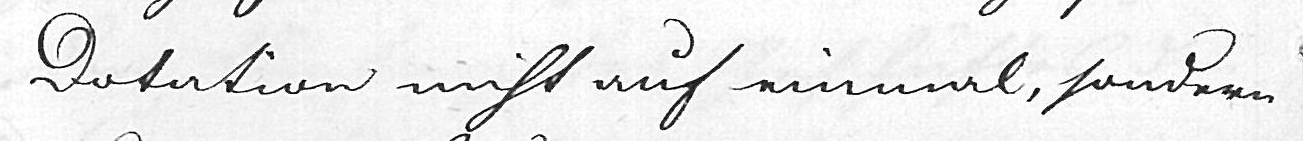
Dotation nicht auf einmal, sondern
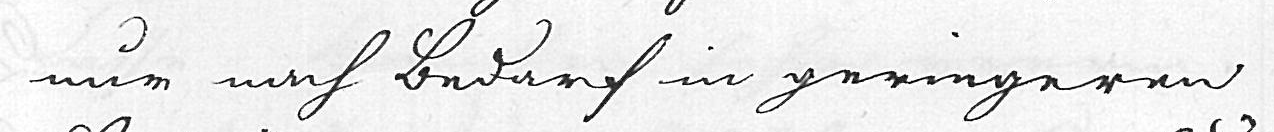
nur nach Bedarf in geringeren
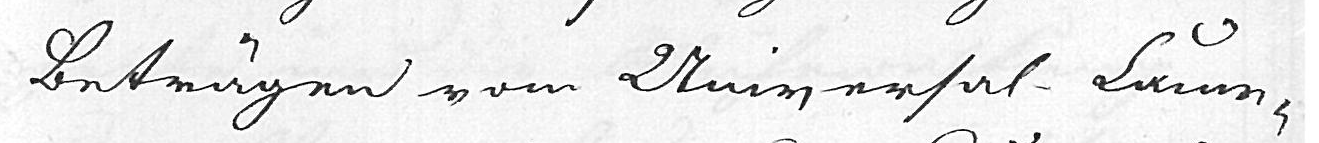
Beträgen vom Unversal-Cam-
